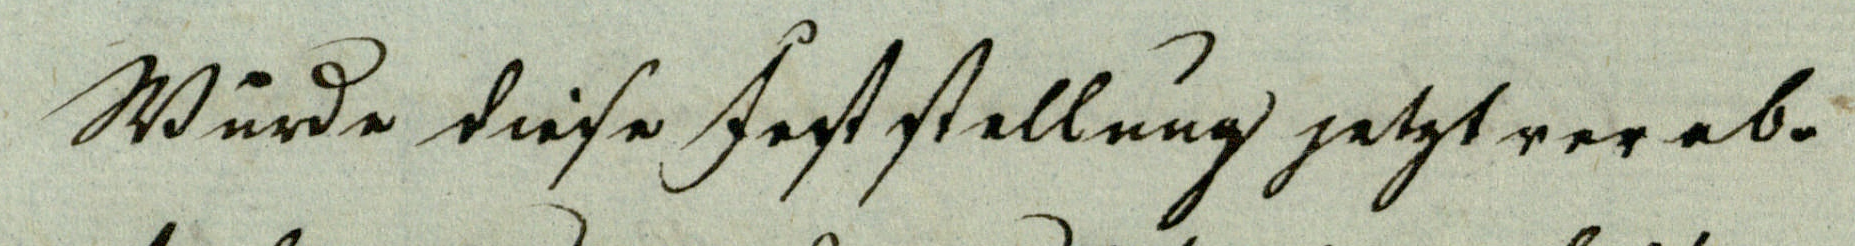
Würde diese Feststellung jetzt verab¬
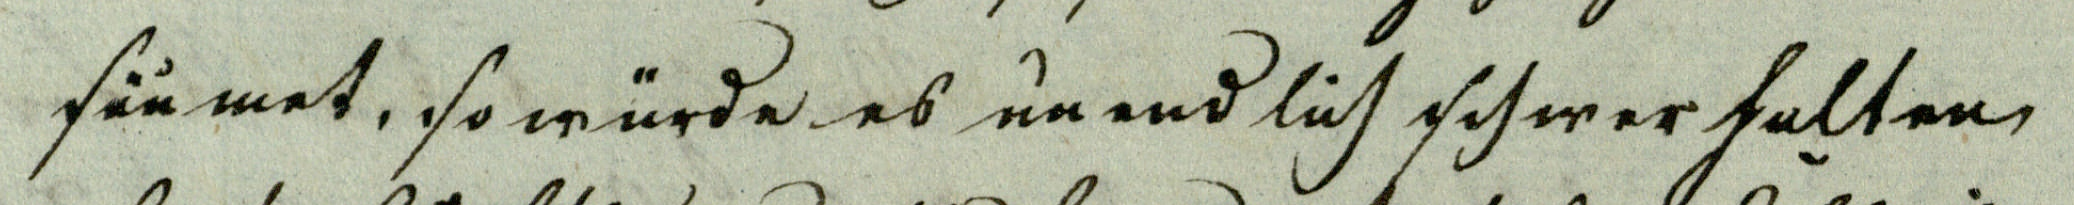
säumet, so würde es unendlich schwer halten
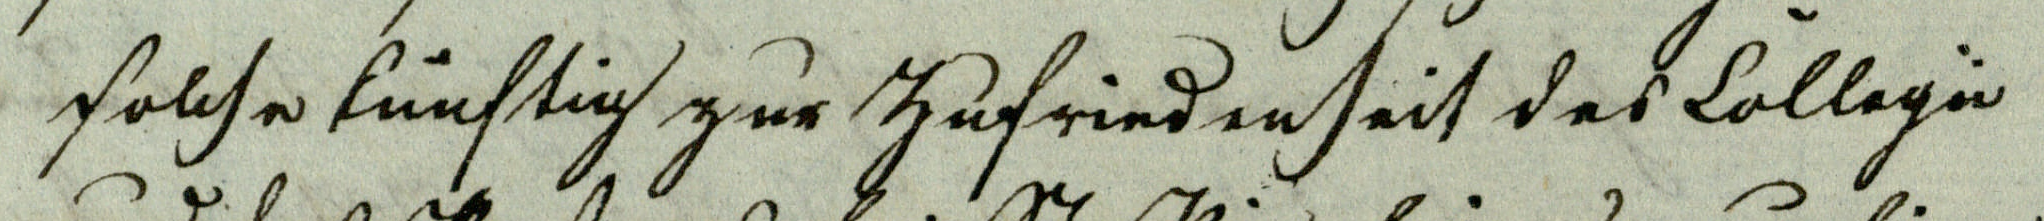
solche künftig zur Zufriedenheit des Collegii
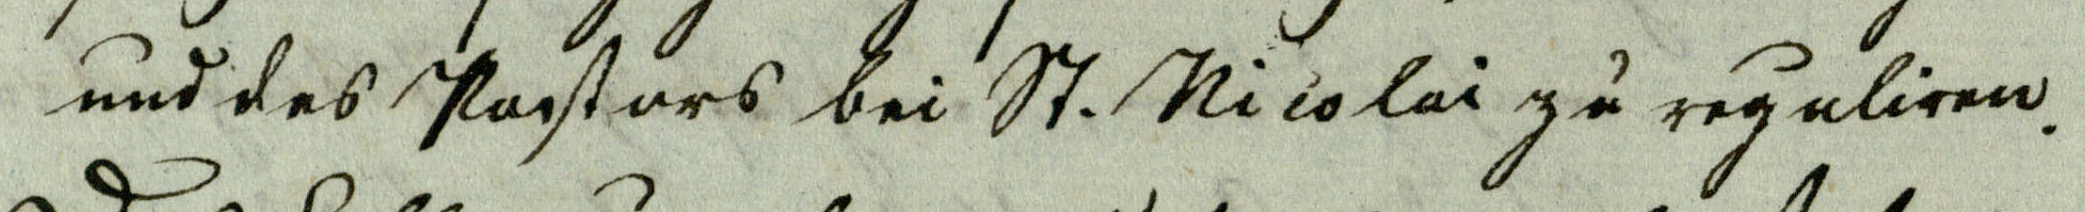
und des Pastors bei St. Nicolai zu reguliren.
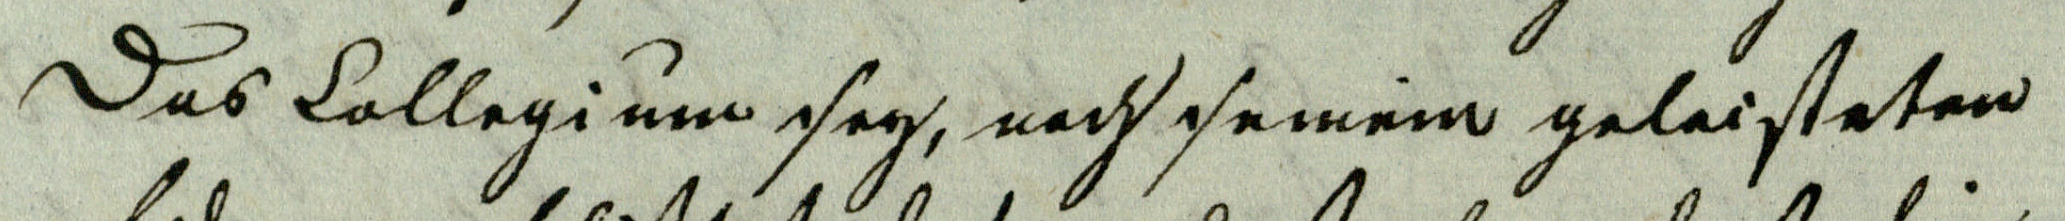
Das Collegium sey, nach seinem geleisteten
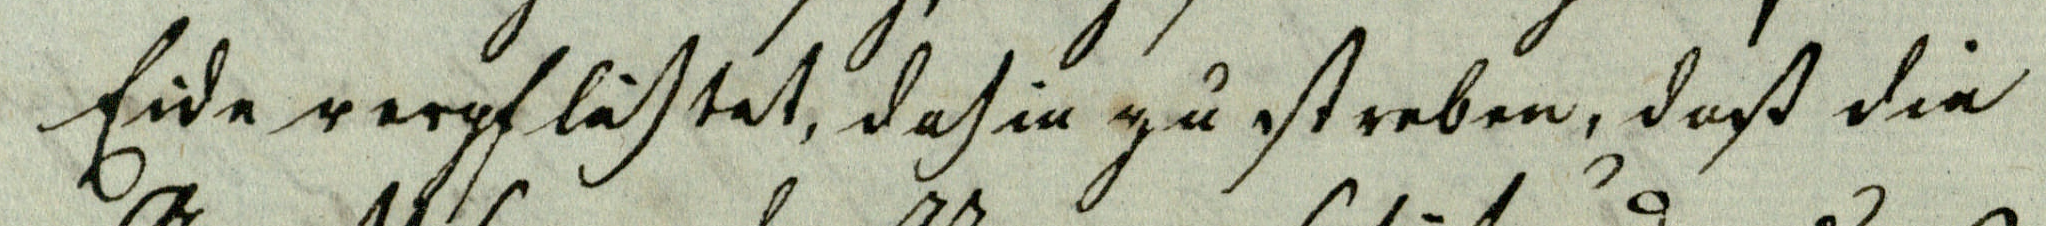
Eide verpflichtet, dahin zu streben, daß die
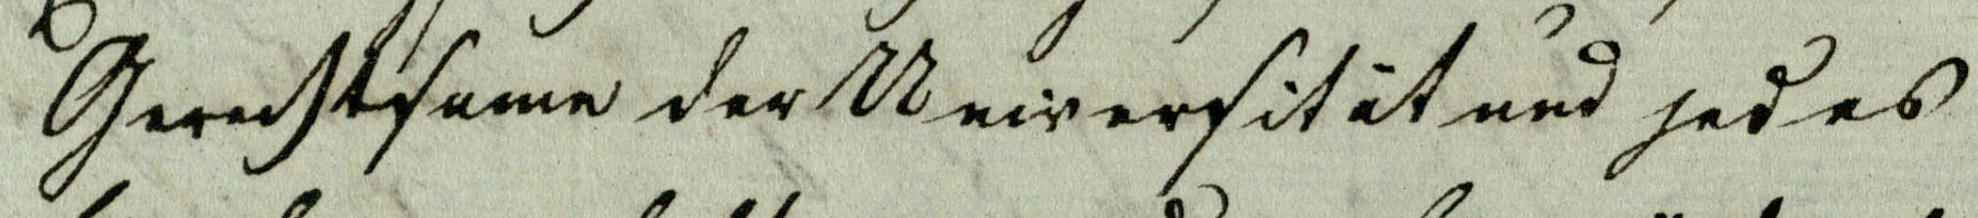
Gerechtsame der Universität und jedes
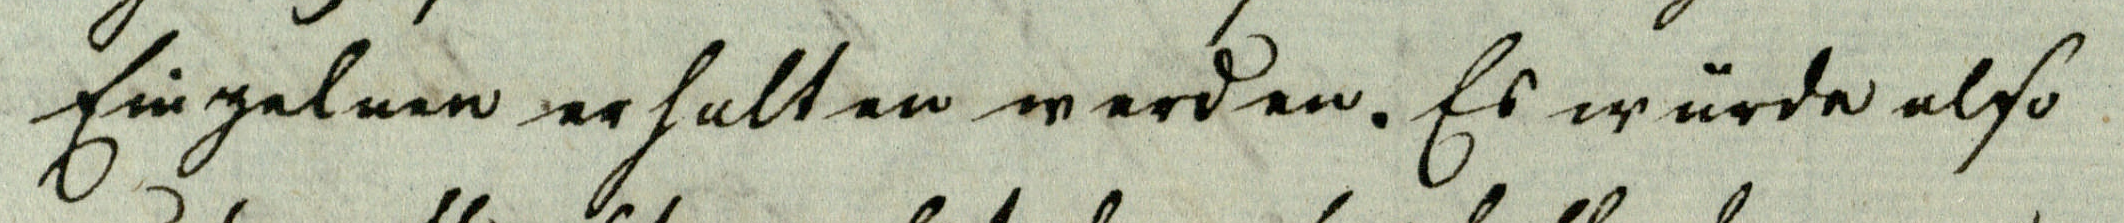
Einzelnen erhalten werden. Es würde also
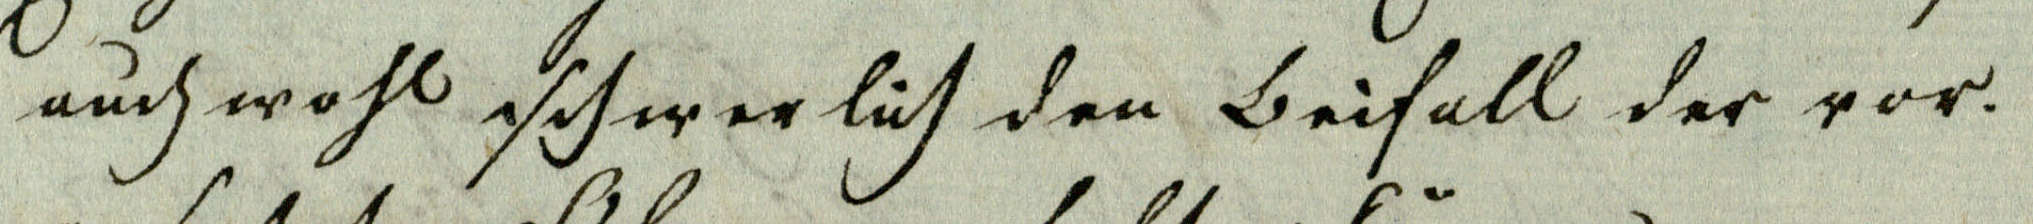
auch wohl schwerlich den Beifall der vor¬
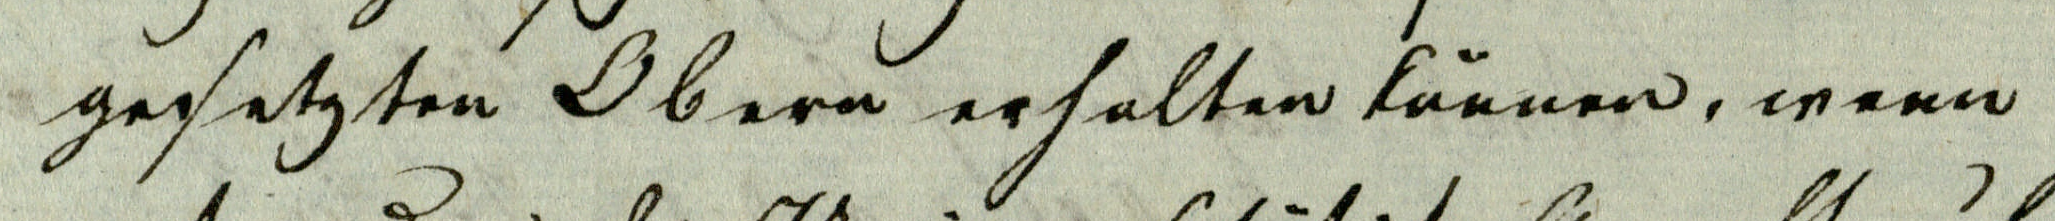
gesetzten Obern erhalten können, wenn
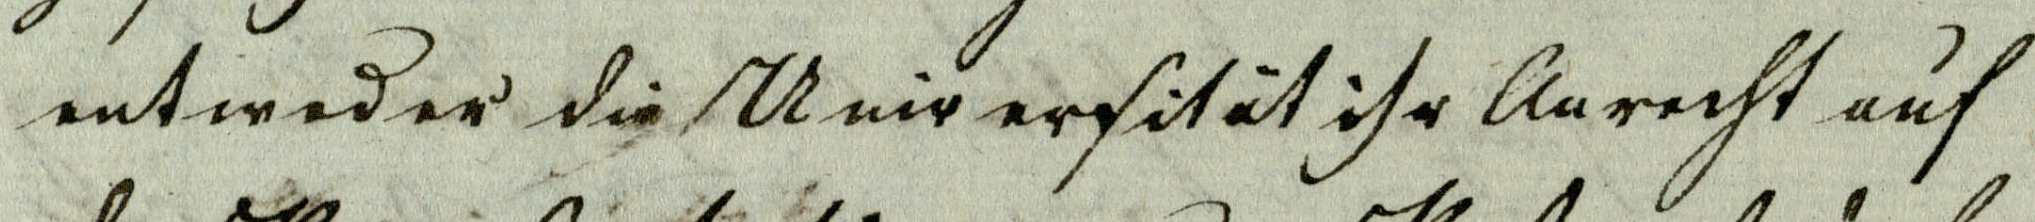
entweder die Universität ihr Anrecht auf
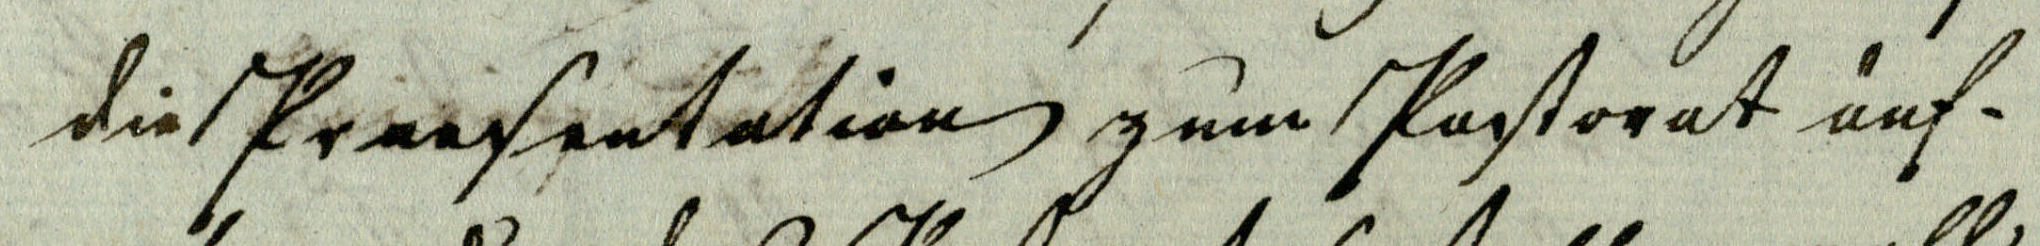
die Praesentation zum Pastorat auf¬
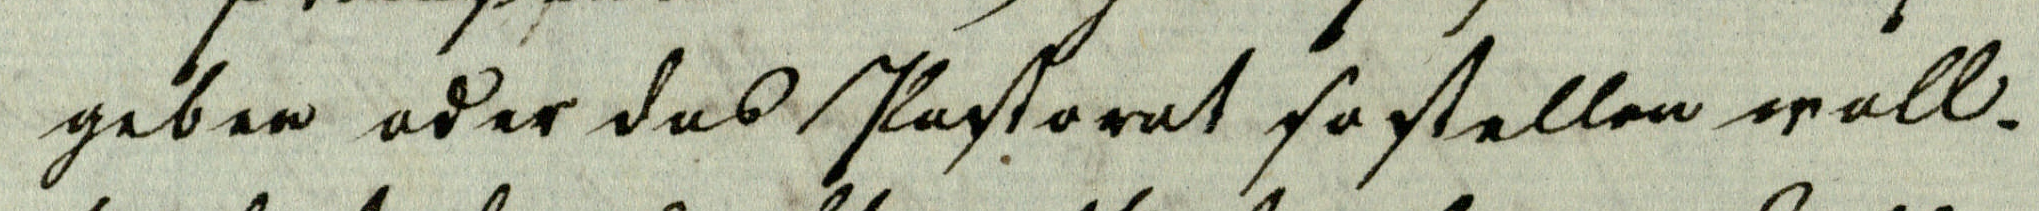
geben oder das Pastorat so stellen woll¬
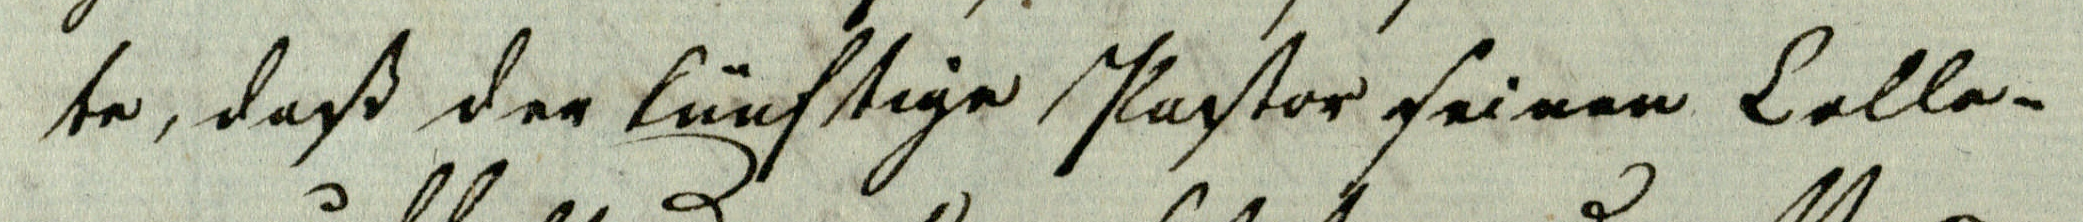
te, daß der künftige Pastor seinen Colle¬
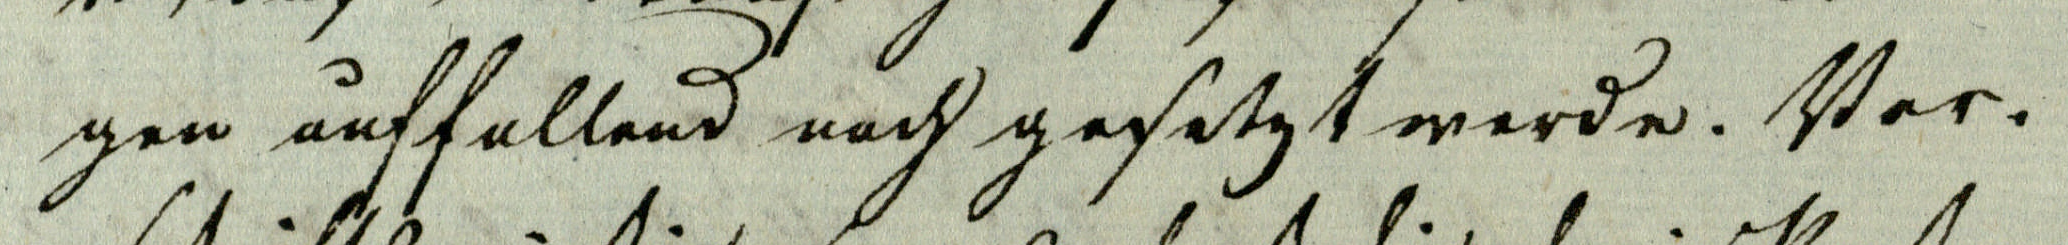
gen auffallend nach gesetzt werde. Vor¬
